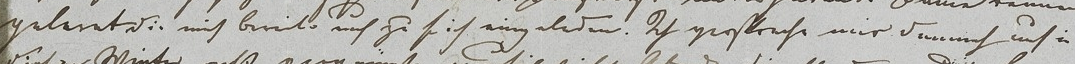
gelernt die mich bereits auch zu sich eingeladen. Ich verspreche mir demnach auch in
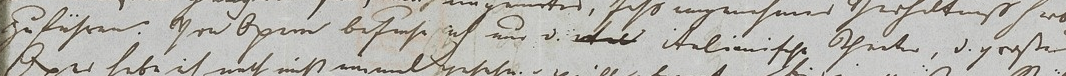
zu führen. Von Opern besuche ich nur d. italitalienische Theater, d. große
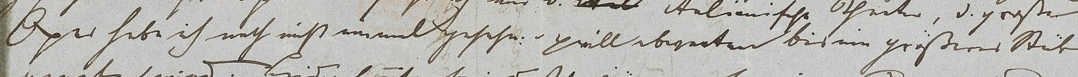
Oper habe ich noch nicht einmal gesehn: – & will abwarten bis ein größeres Stük
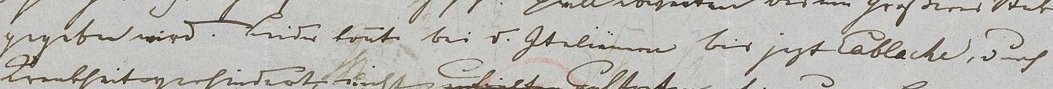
gegeben wird. Leider konnte bei d. Italiänern bis jezt Lablache, durch
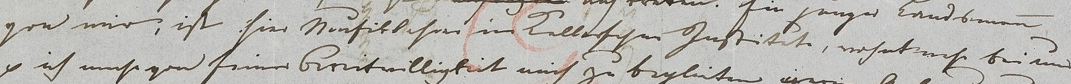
von mir, ist hier Musiklehrer im Kellerschen Institute, wohnt nahe bei uns
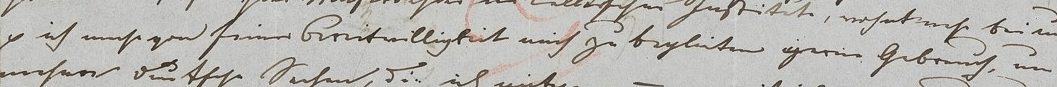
& ich mache von seiner Bereitwilligkeit mich zu begleiten gerne Gebrauch, um
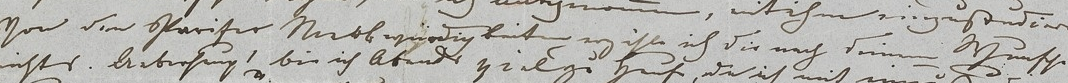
Von den Pariser Merkwürdigkeiten erzähle ich dir nach deinem Wunsche
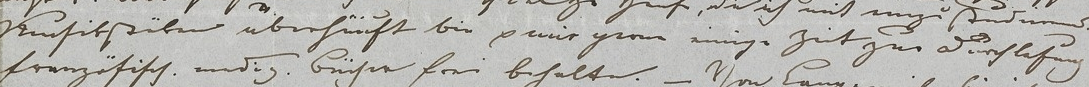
Musikstüken überhäuft bin & mir gerne einige Zeit zur Durchlesung
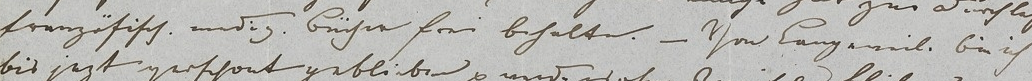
französisch. mediz. Bücher frei behalte. –Von Langeweile bin ich
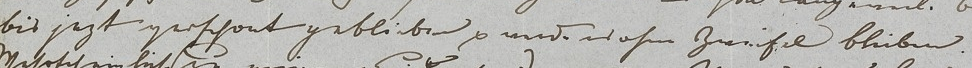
bis jezt verschont geblieben & werde es ohne Zweifel bleiben.
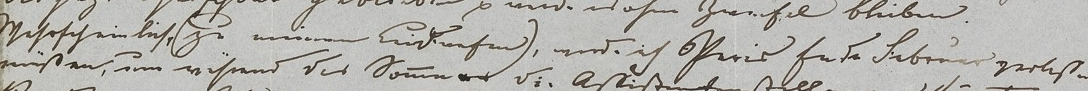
Wahrscheinlich, (zu meinem Leidwesen), werde ich Paris Ende Februar verlassen
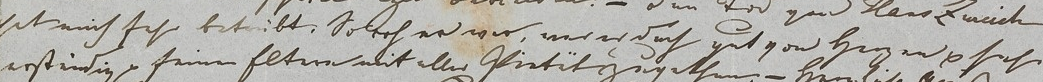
hat mich sehr betrübt. So roh er war, war er doch gut von Herzen & sehr
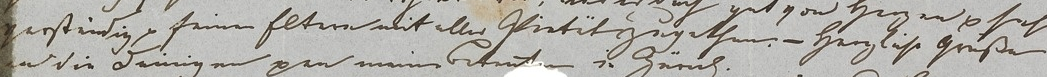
verständig & seinen Eltern mit aller Pietät zugethan. – Herzliche Grüße
